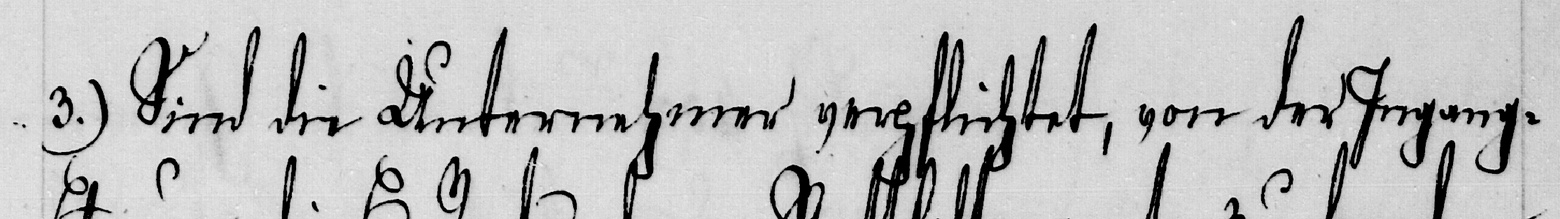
3.) Sind die Unternehmer verpflichtet, von der Ingang¬
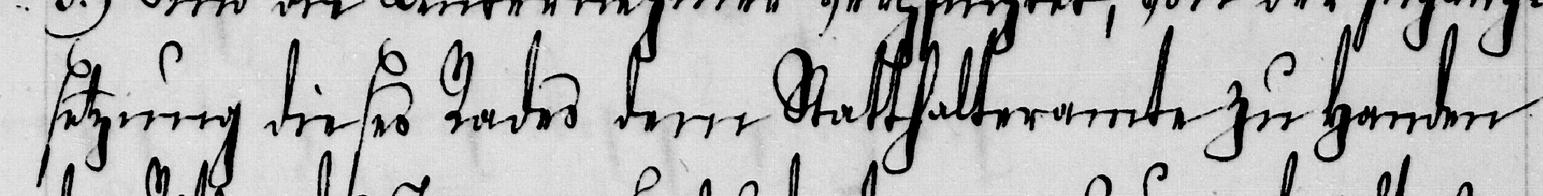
setzung dieses Rades dem Statthalteramte zu Handen
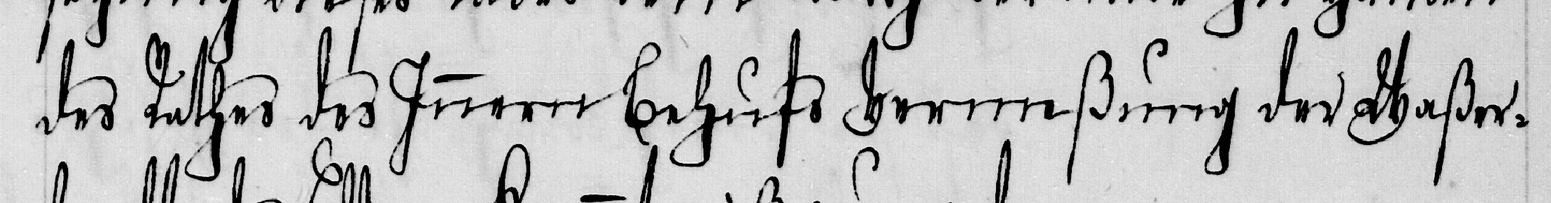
des Rathes des Innern Behufs Vermeßung der Waßer¬
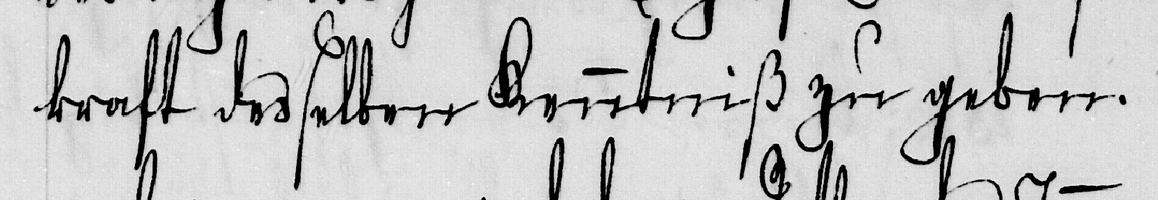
kraft desselben Kenntniß zu geben.
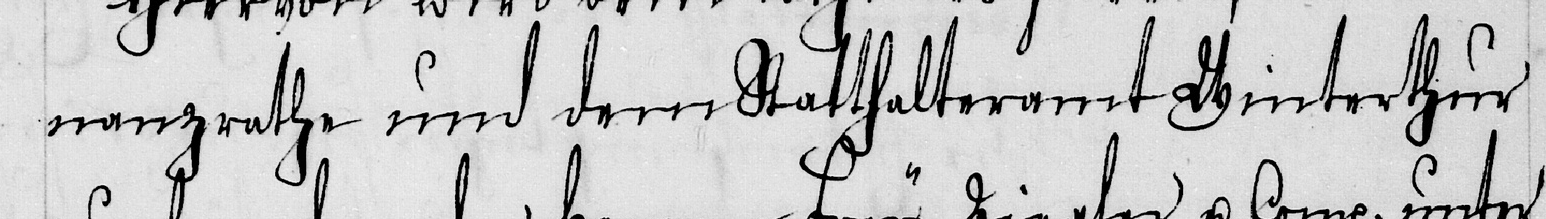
nanzrathe und dem Statthalteramt Winterthur
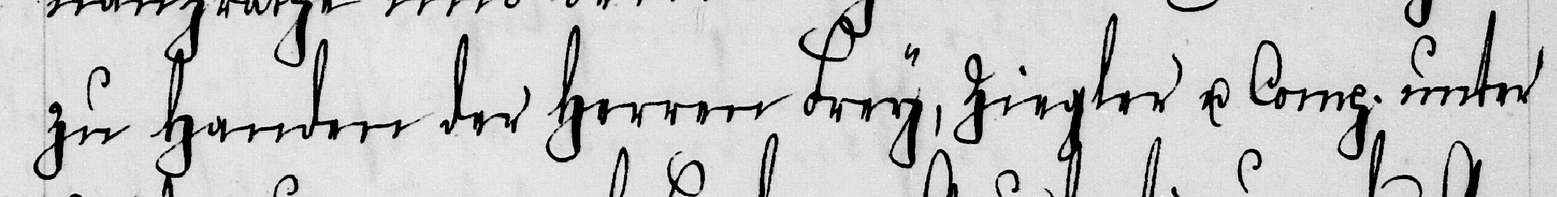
zu Handen der Herren Frey, Ziegler & Comp. unter
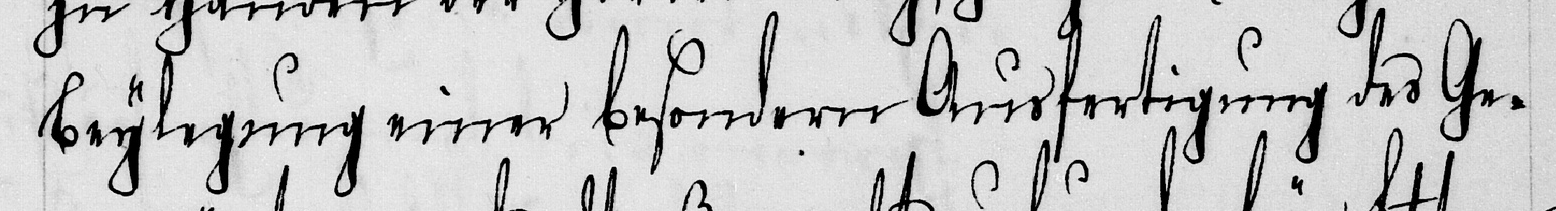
Beylegung einer besondern Ausfertigung des Ge¬
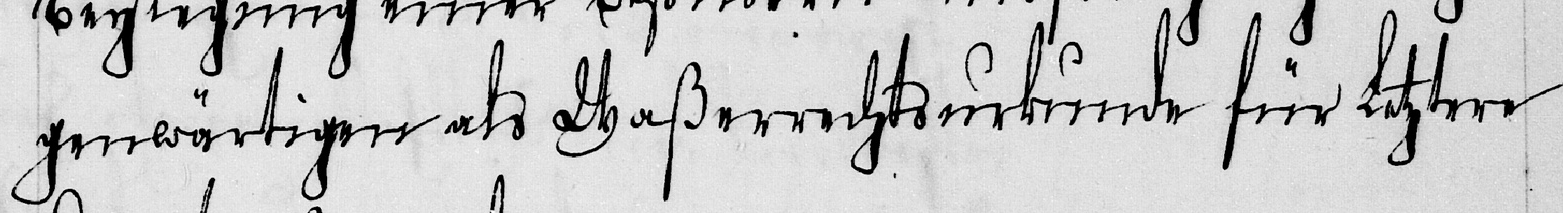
genwärtigen als Waßerrechtsurkunde für Letztere
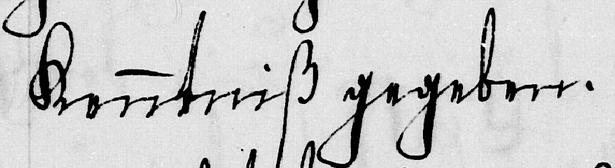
Kenntniß gegeben.
